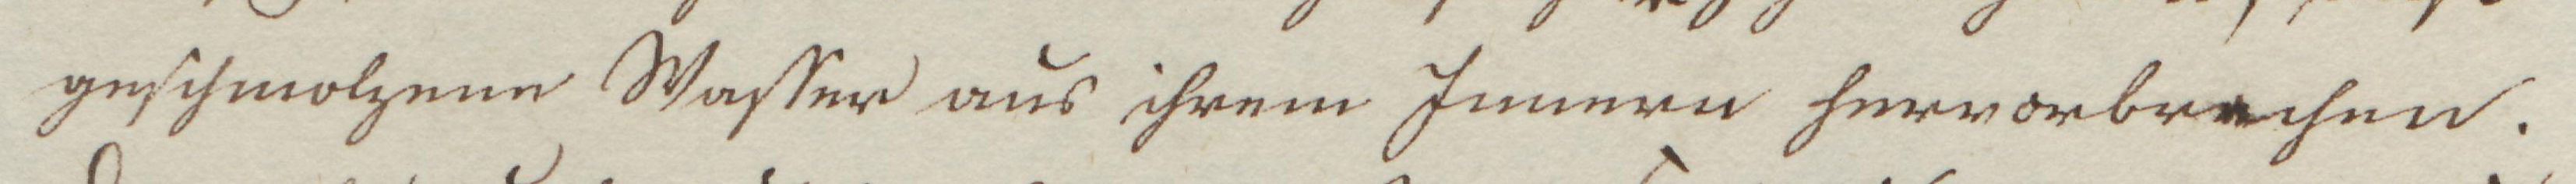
geschmolzene Wasser aus ihrem Innern hervorbraechen.
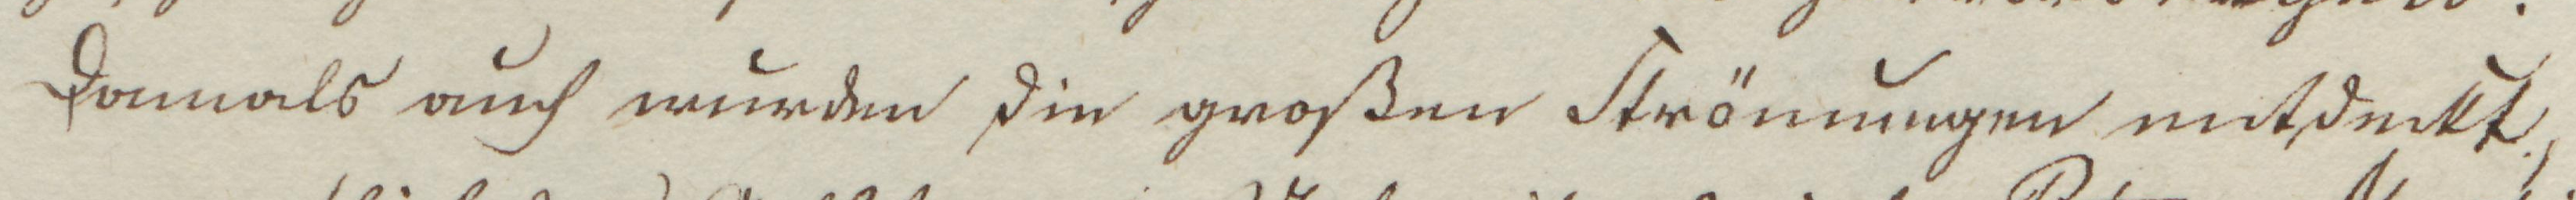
Damals auch wurden die großen Strömungen entdeckt,
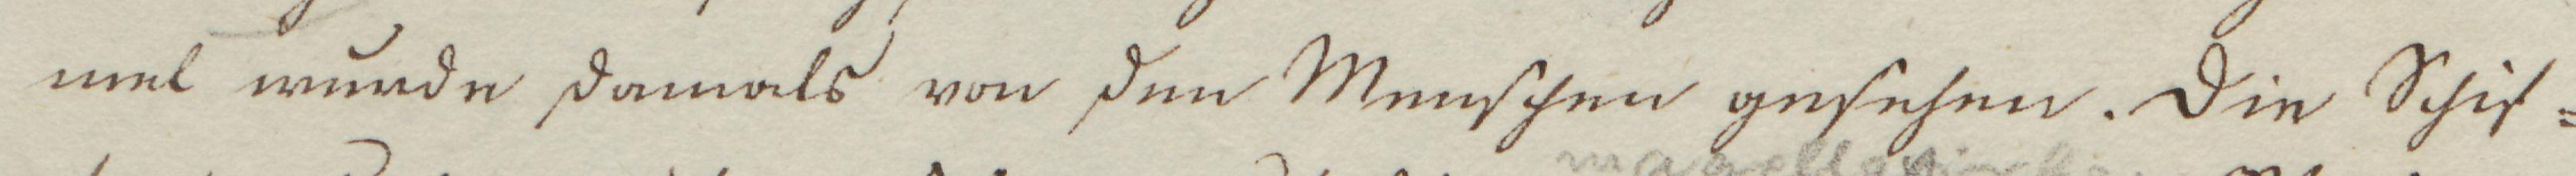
mel wurde damals von den Menschen gesehen. Die Schif-
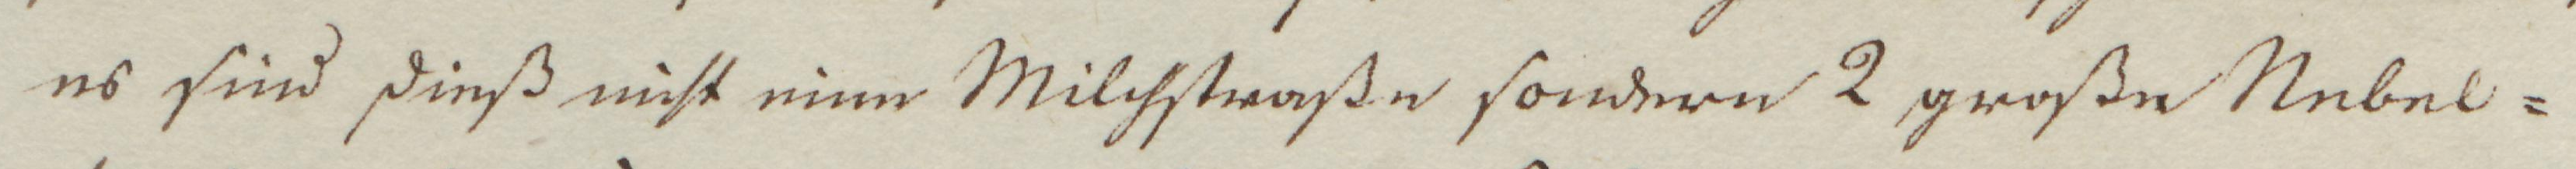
es sind dieß nicht eine Milchstraße sondern 2 große Nebel-
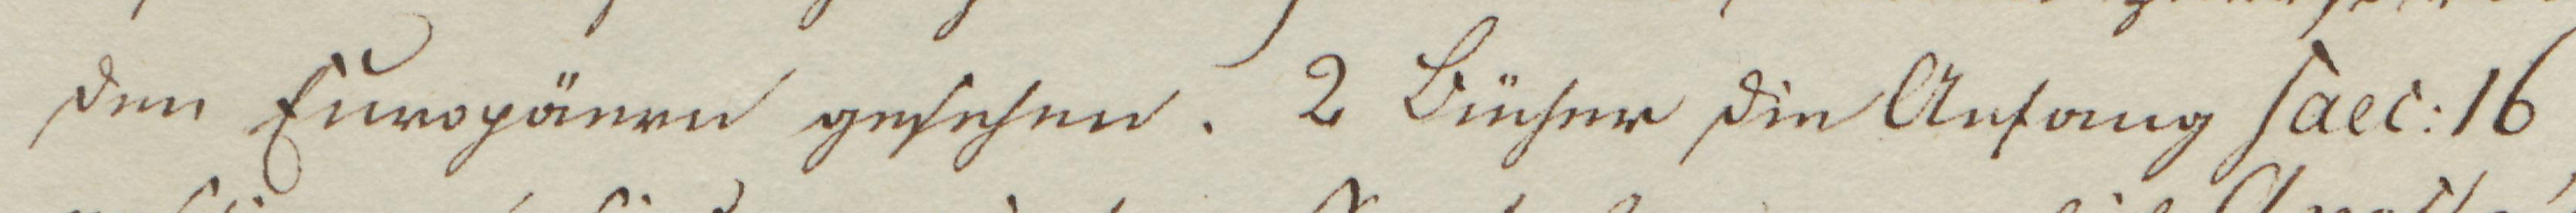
den Europäern gesehen. 2 Bücher die Anfang saec: 16
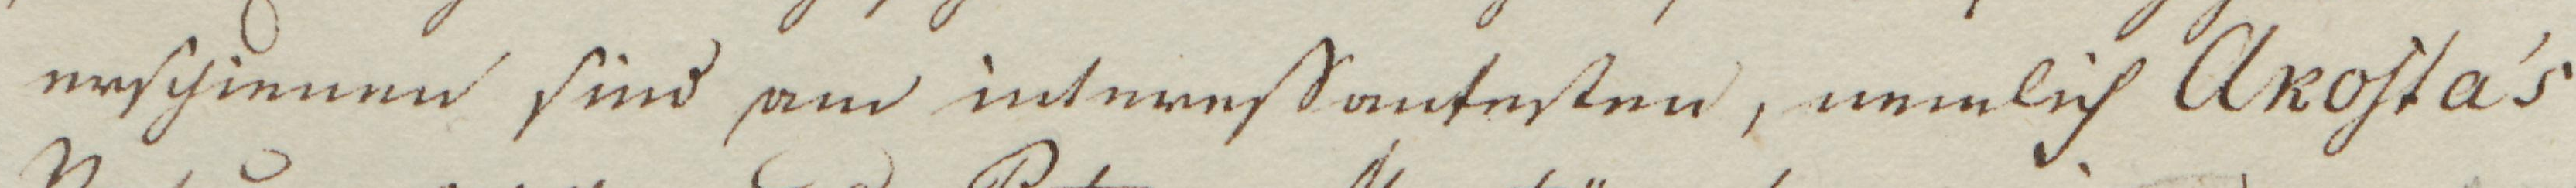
erschienen sind am interessantesten, nemlich Akosta's
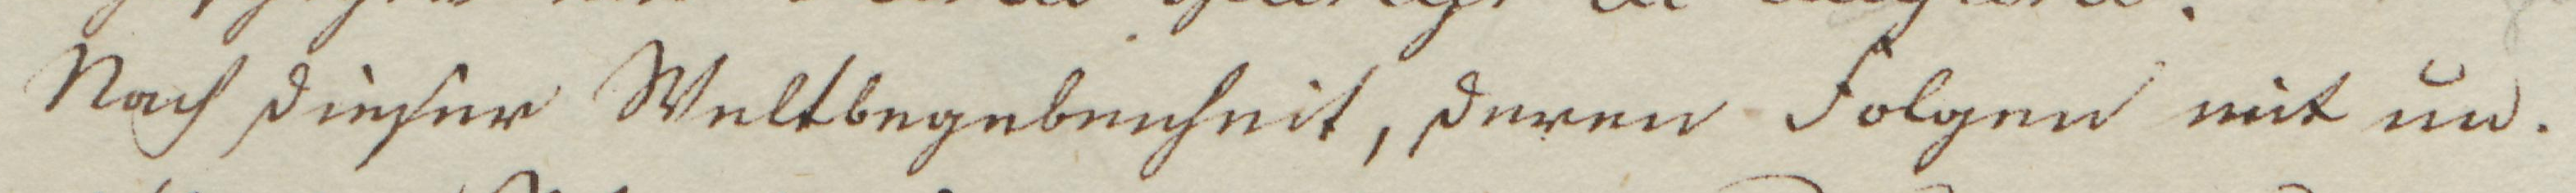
Nach dieser Weltbegebenheit, deren Folgen mit un-
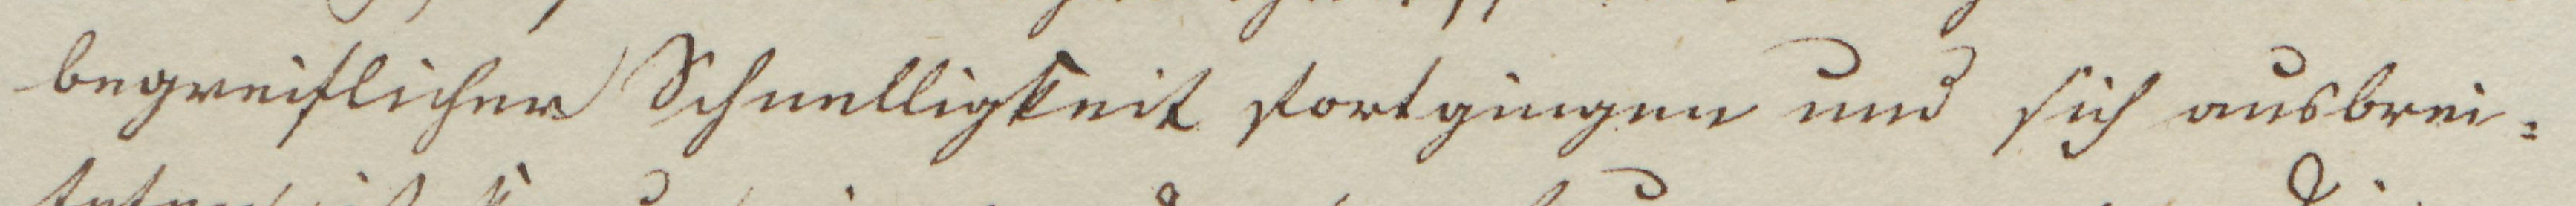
begreiflicher Schnelligkeit fortgingen und sich ausbrei-
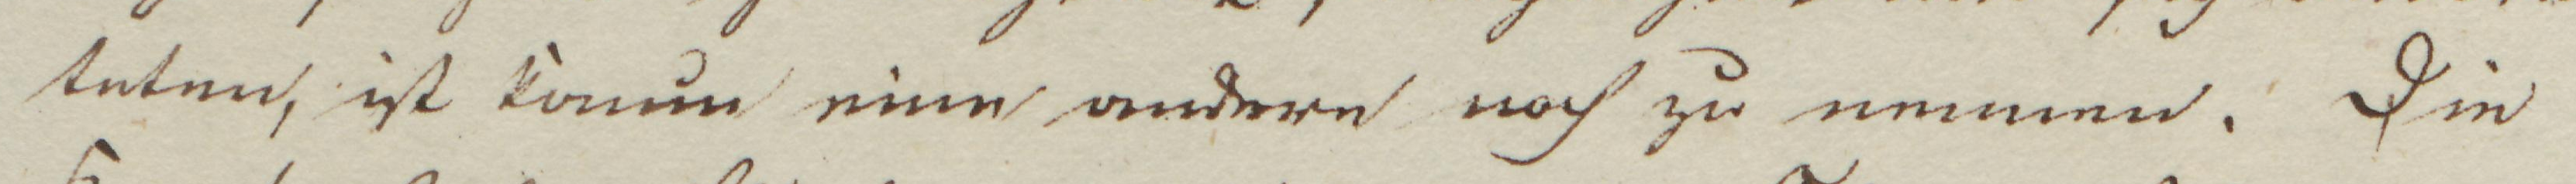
teten, ist kaum eine andere noch zu nennen. Die
